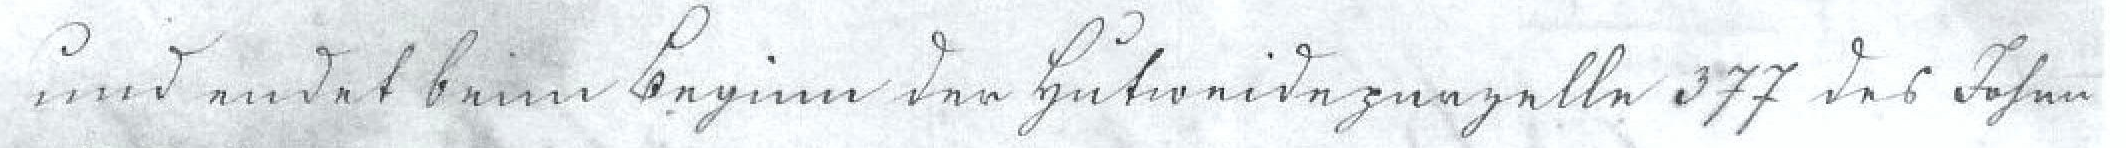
und endet beim Beginn der Hutweideparzelle 377 des Johan
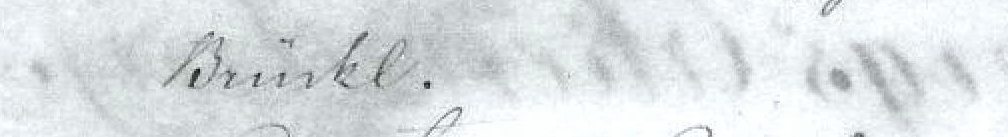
Brückl.
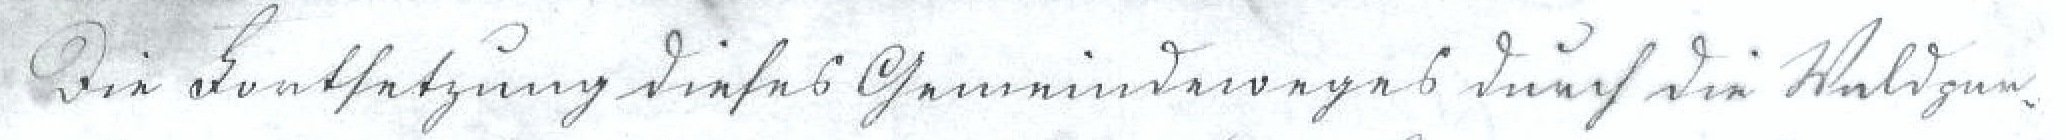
Die Fortsetzung dieses Gemeindeweges durch die Waldpar¬
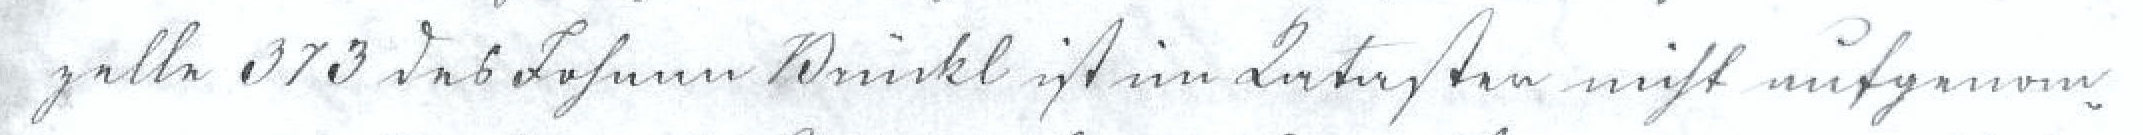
zelle 373 des Johann Brückl ist im Kataster nicht aufgenom¬
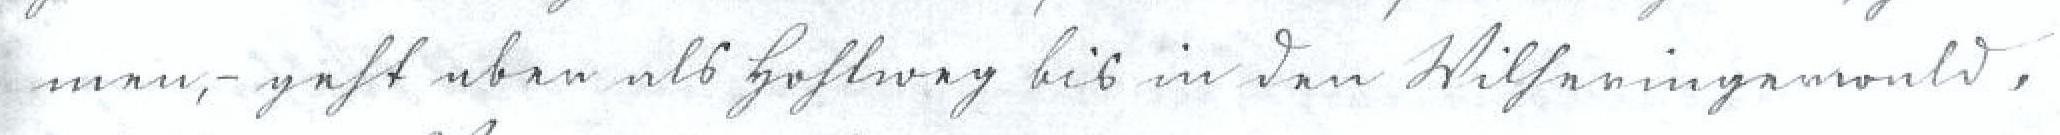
men,- geht aber als Hohlweg bis in den Wilheringerwald,
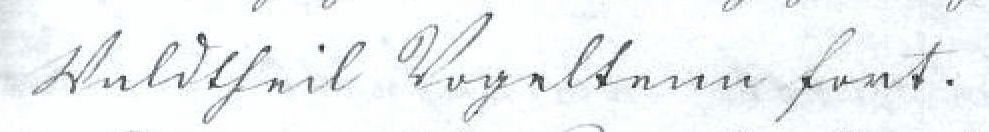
Waldtheil Vogeltenn fort.
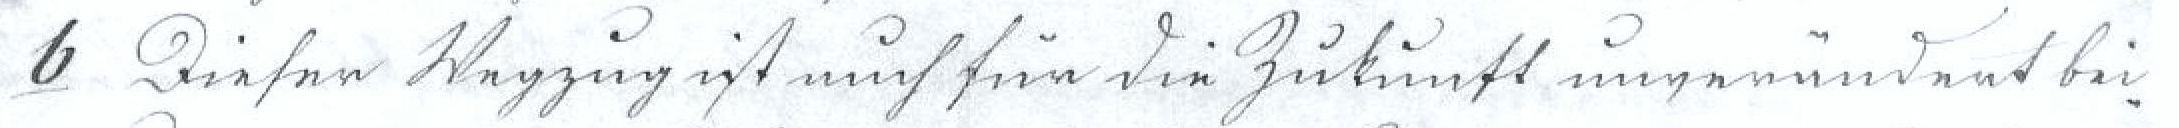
b Dieser Wegzug ist auch für die Zukunft unverändert bei¬
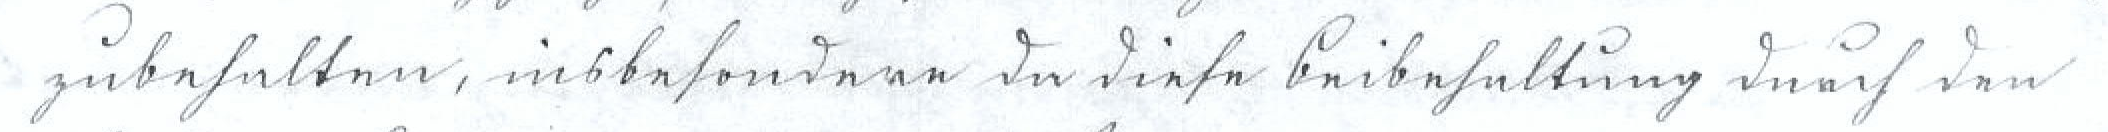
zubehalten, insbesondere da diese Beibehaltung durch den
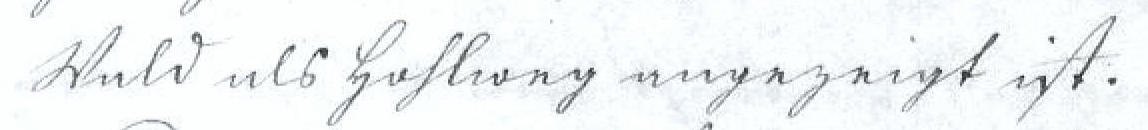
Wald als Hohlweg angezeigt ist.
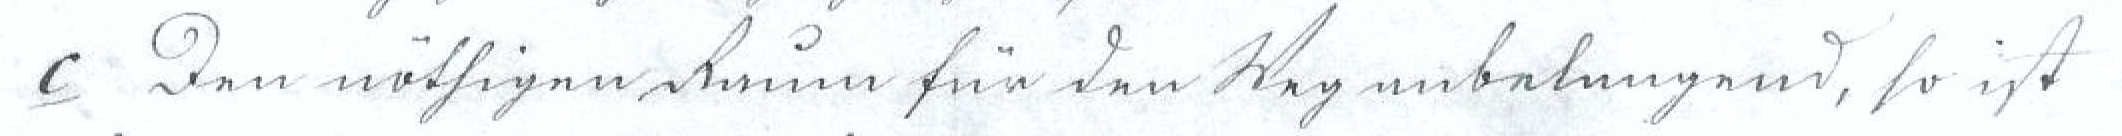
c Den nöthigen Raum für den Weg anbelangend, so ist
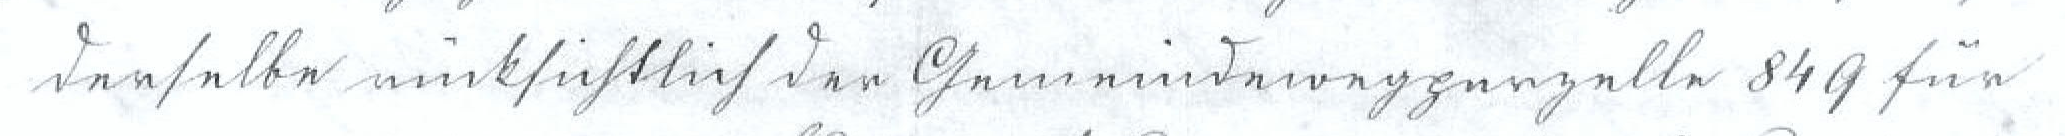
derselbe rücksichtlich der Gemeindewegparzelle 849 für
